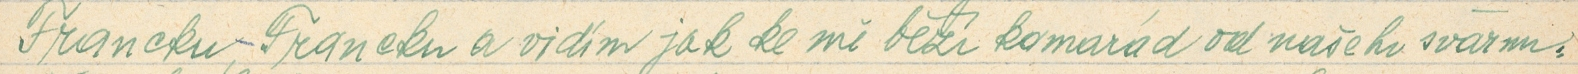Francku-Francku a vidím jak ke mě běží kamarád od našeho švarmu..
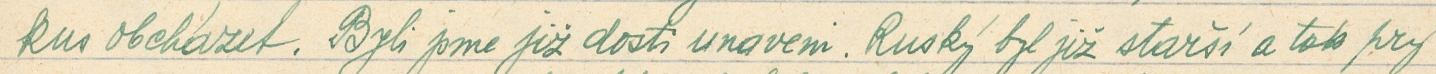kus obcházet. Byli jsme již dosti unaveni. Ruský byl již starší a tak prý
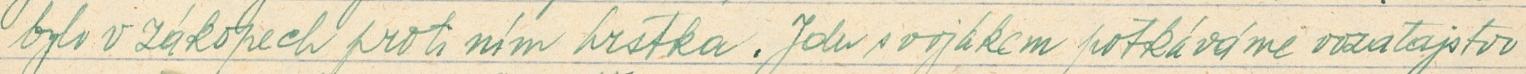bylo v zákopech proti ním hrstka. Jdu s vojákem potkáváme vozatajstvo
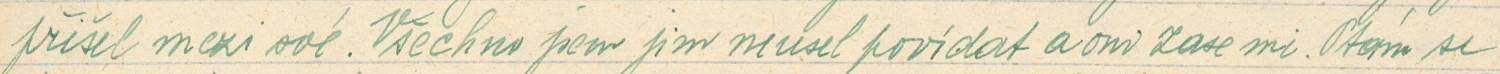přišel mezi své. Všechno jsem jim musel povídat a oni zase mi. Ptám se
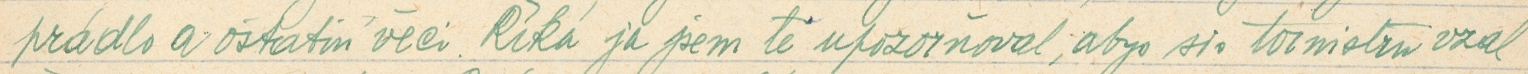prádlo a ostatní věci. Říká ja jsem tě upozorňoval, abys sis tornistru vzal
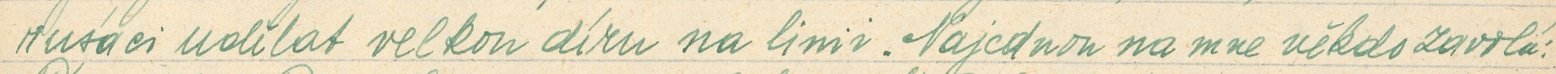rusáci udělat velkou díru na linii. Najednou na mne někdo zavolá:
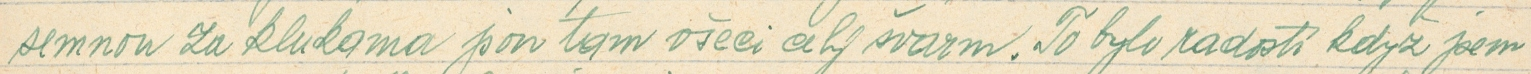semnou za klukama jsou tam všeci celý švarm. To bylo radostí když jsem
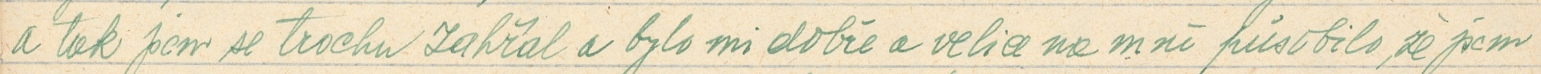a tak jsem se trochu zahřál a bylo mi dobře a velice na mně působilo, že jsem
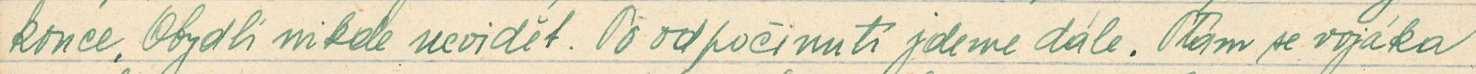konce. Obydlí nikde nevidět. Po odpočinutí jdeme dále. Ptám se vojáka
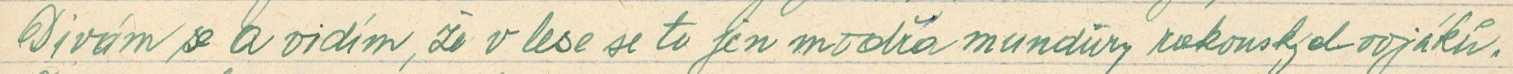Dívám se a vidím, že v lese se to jen modřá mundůry rakouských vojáků.
